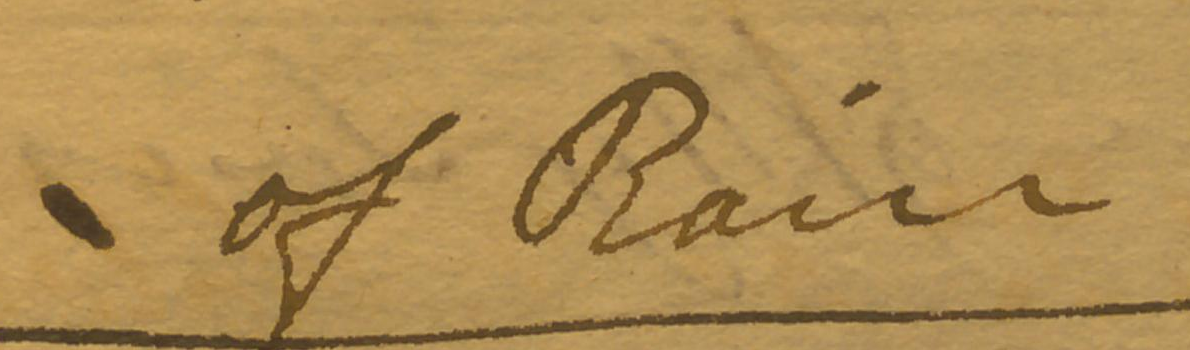of Rain
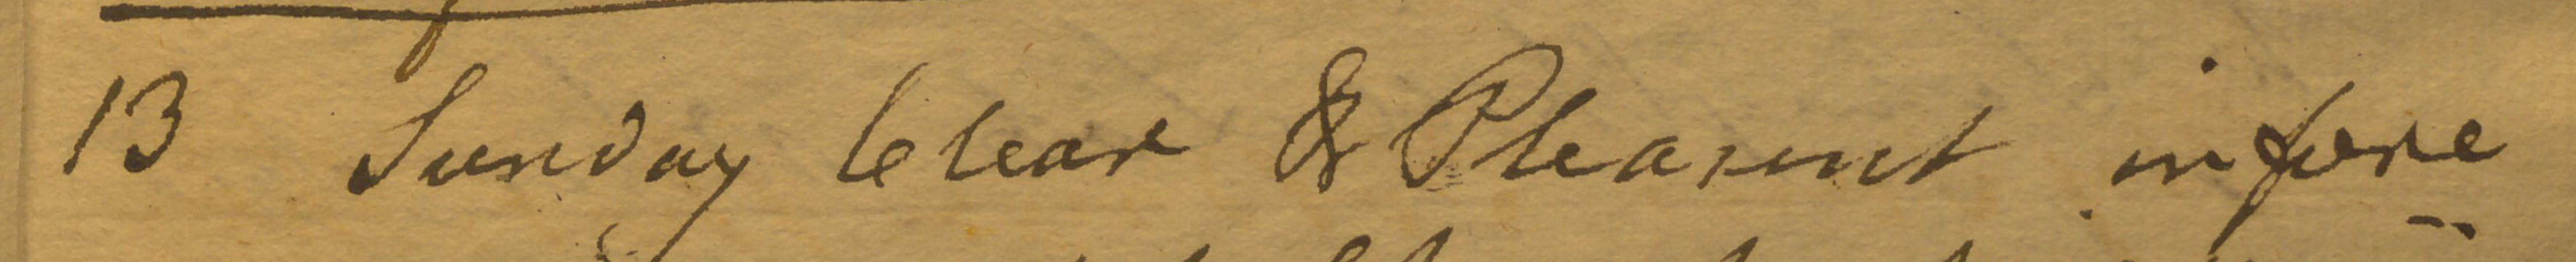13 Sunday Clear & Pleasent in fore
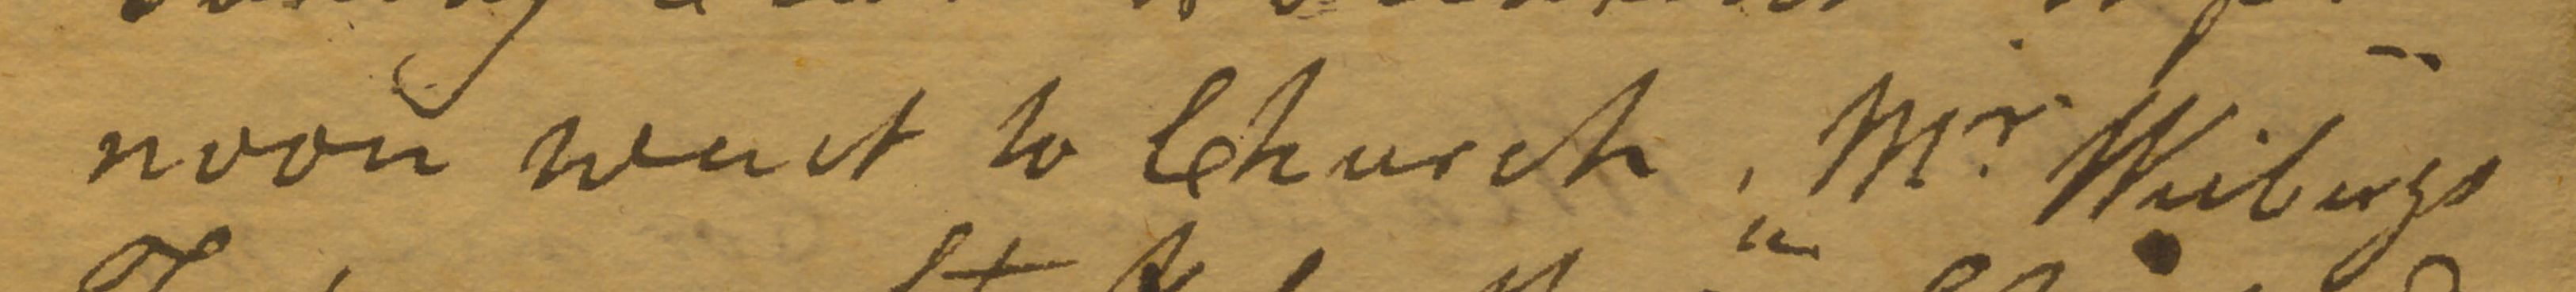noon went to Church, M^r. Weibergs
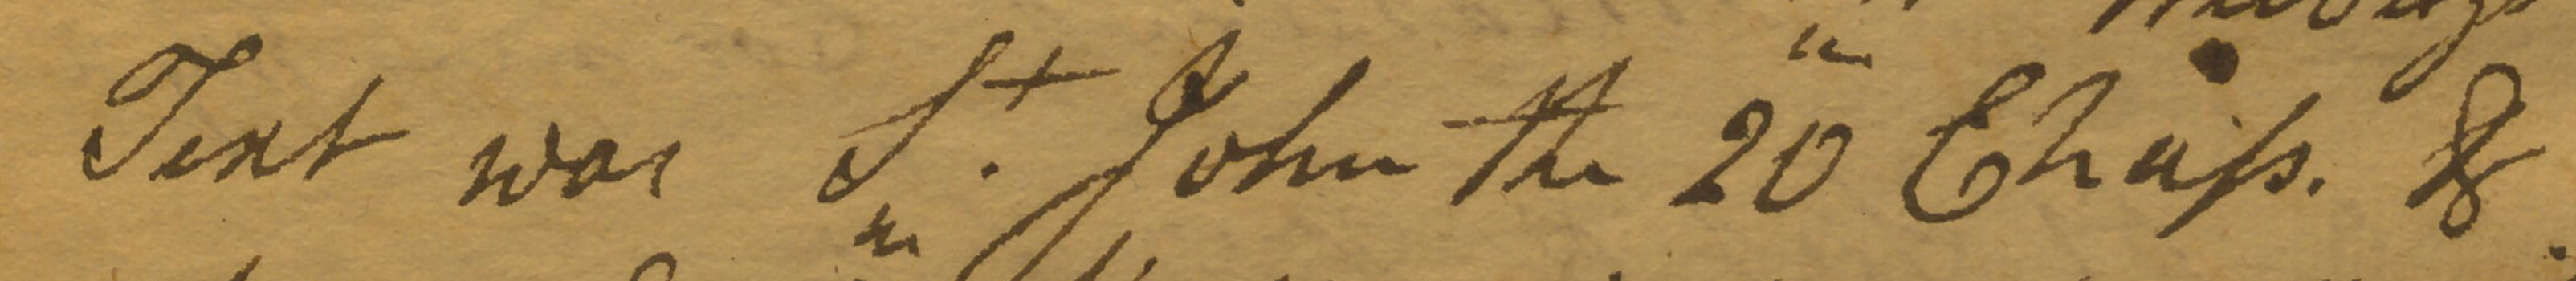Text was S^t. John the 20^th Chap. &
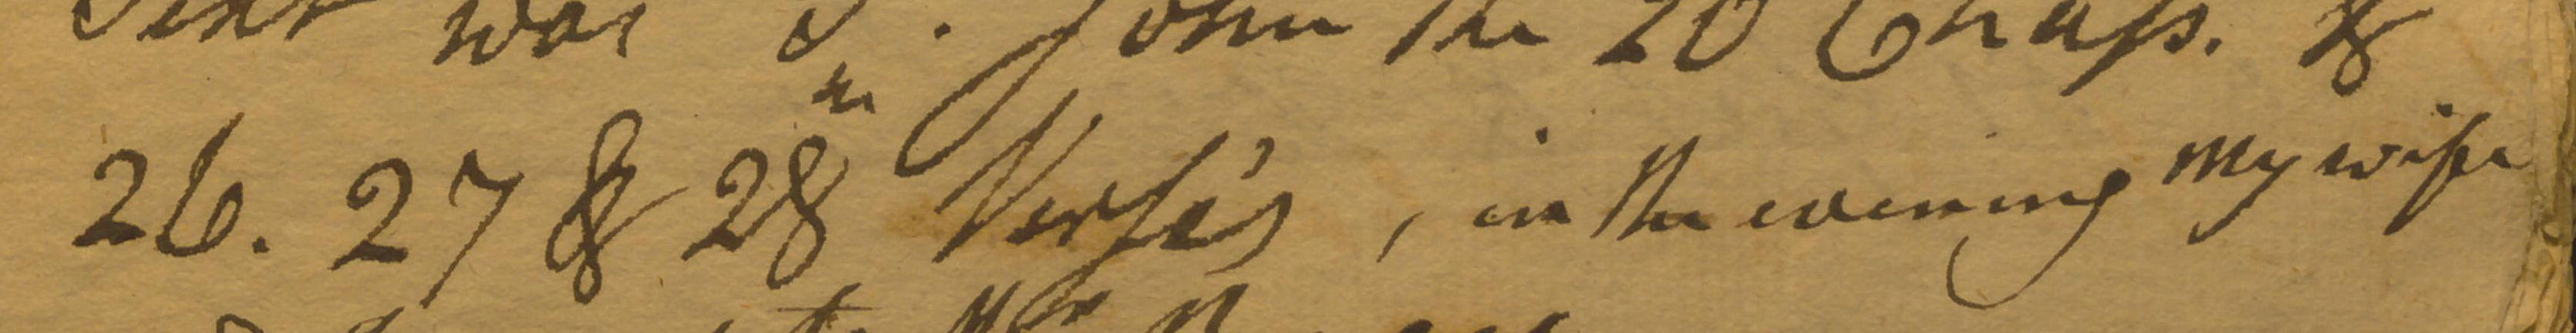26. 27 & 28 Verse's, in the evening my wife
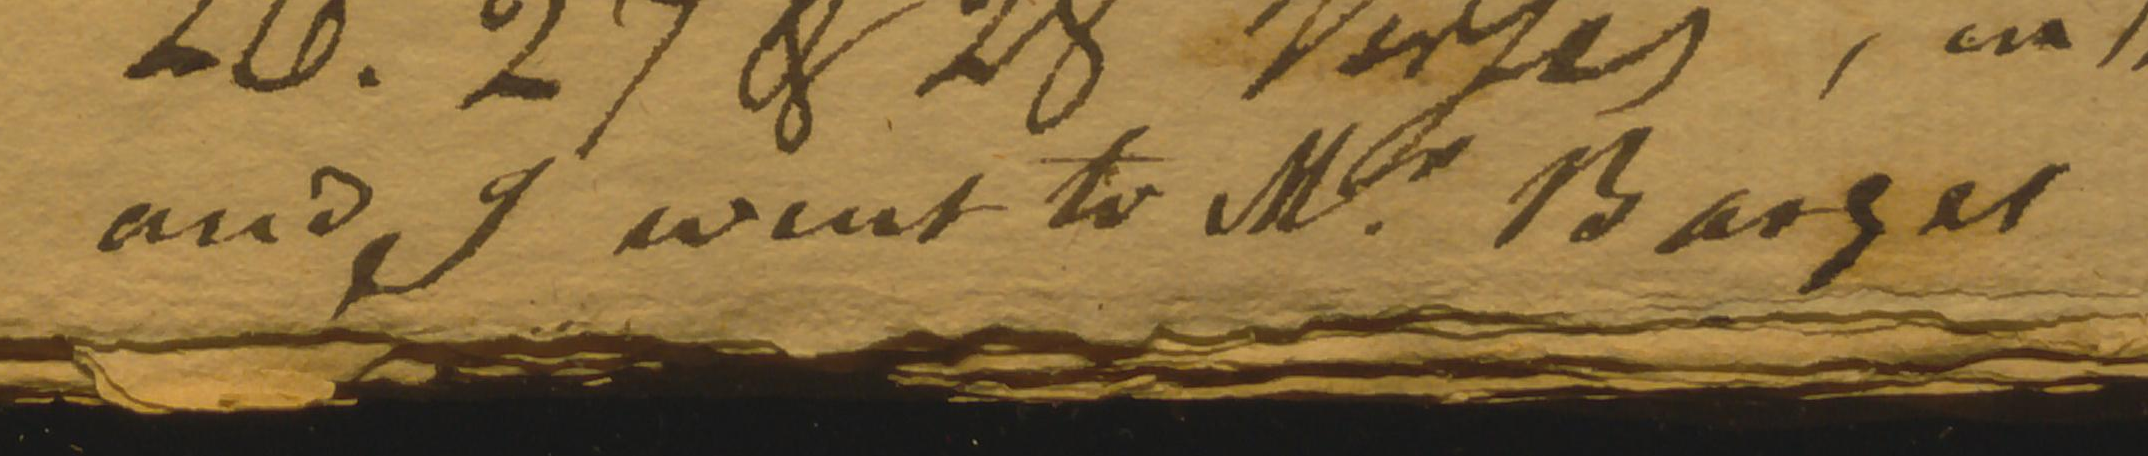and, I went to M^r. Barges
